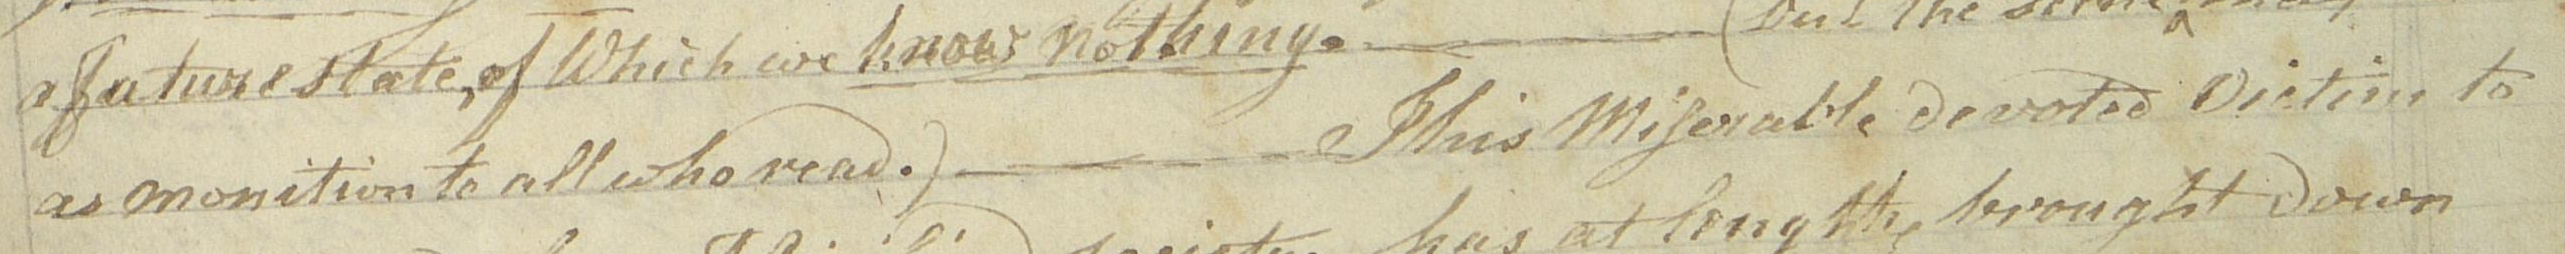as monition to all who read.) This Miserable devoted Victim to
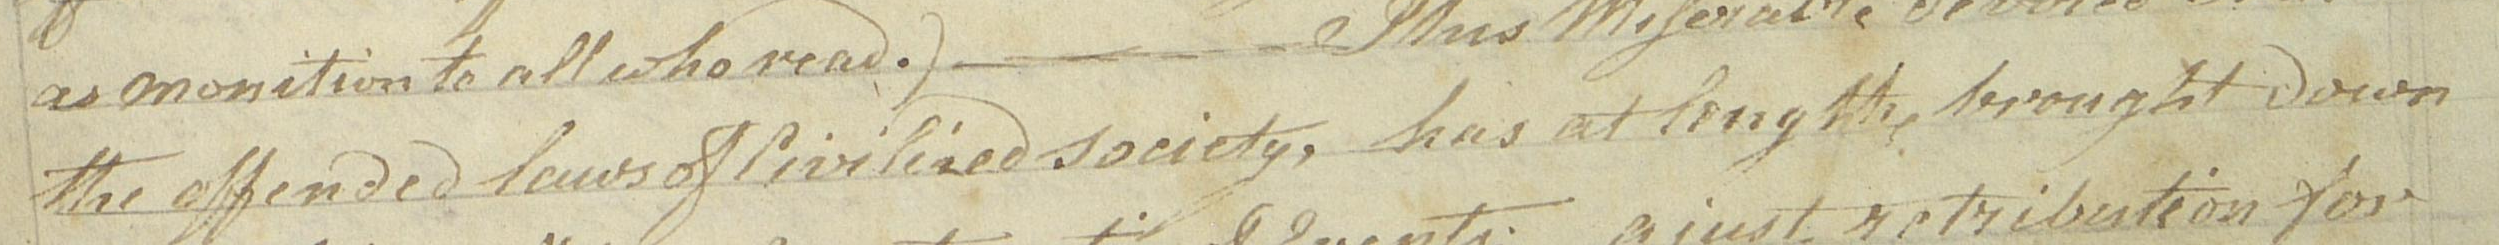the offended laws of Civilized society, has at length brought down
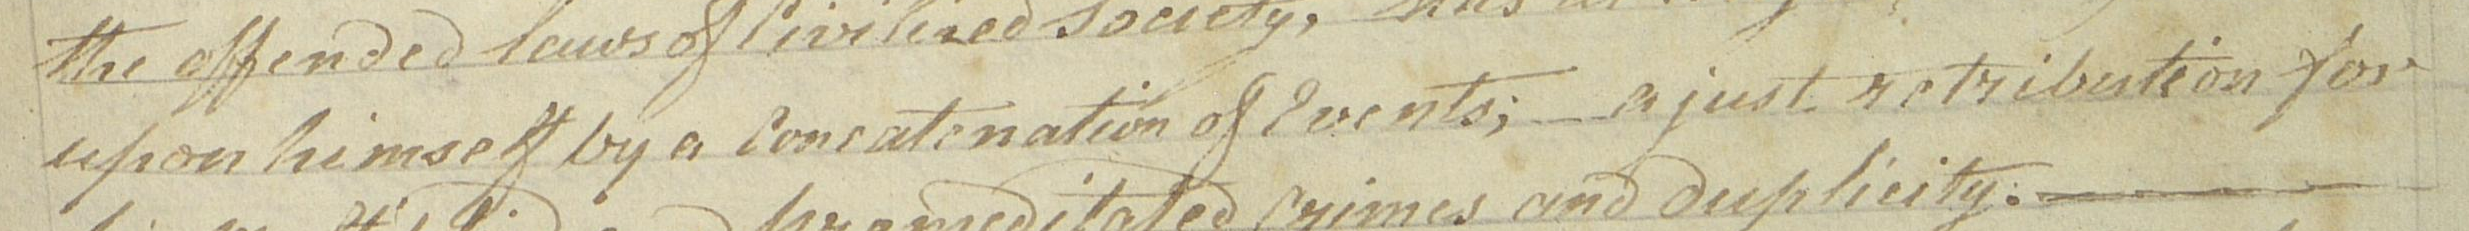upon himself by a concatenation of Events; a just retribution for
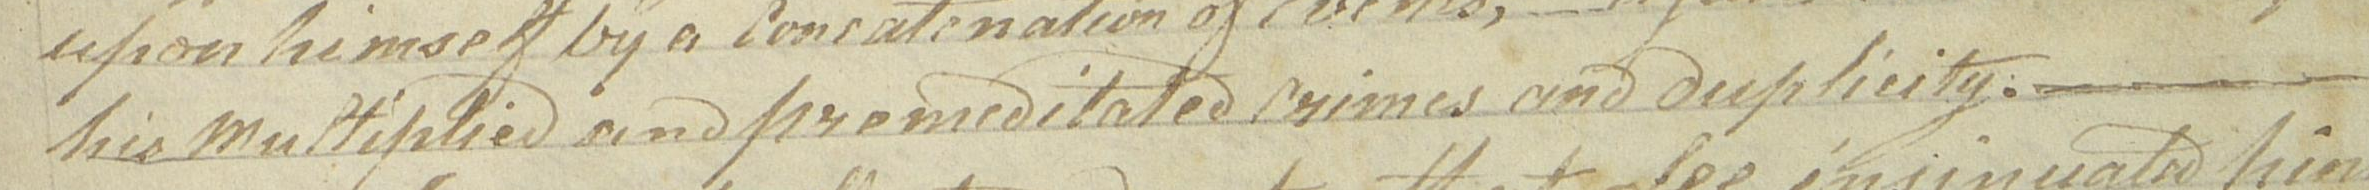his multiplied and premeditated crimes and duplicity.
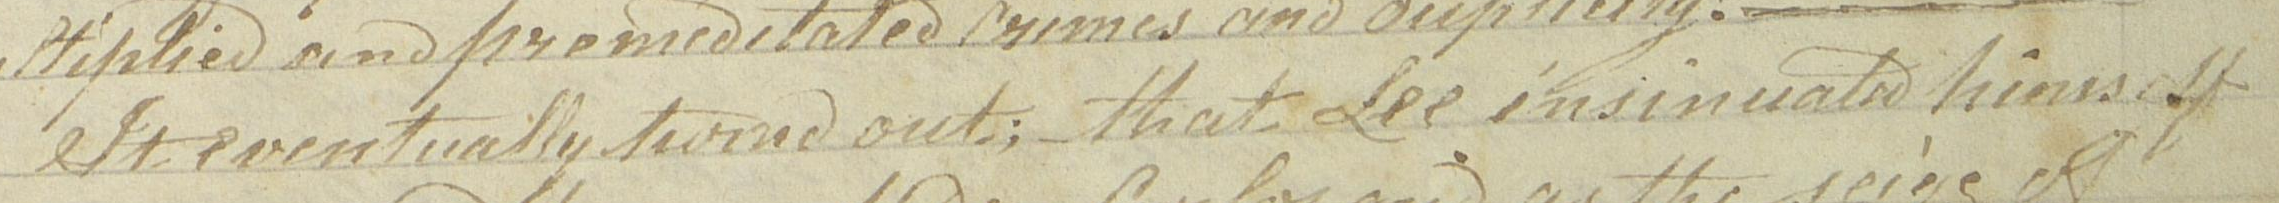It eventually turnd out; that Lee insinuated himself
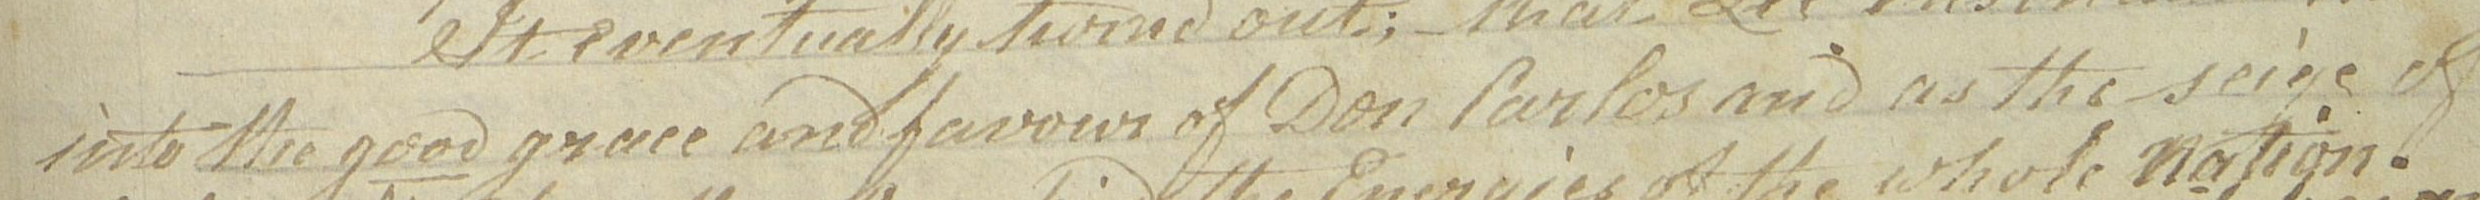into the good grace and favour of Don Carlos and as the seige of
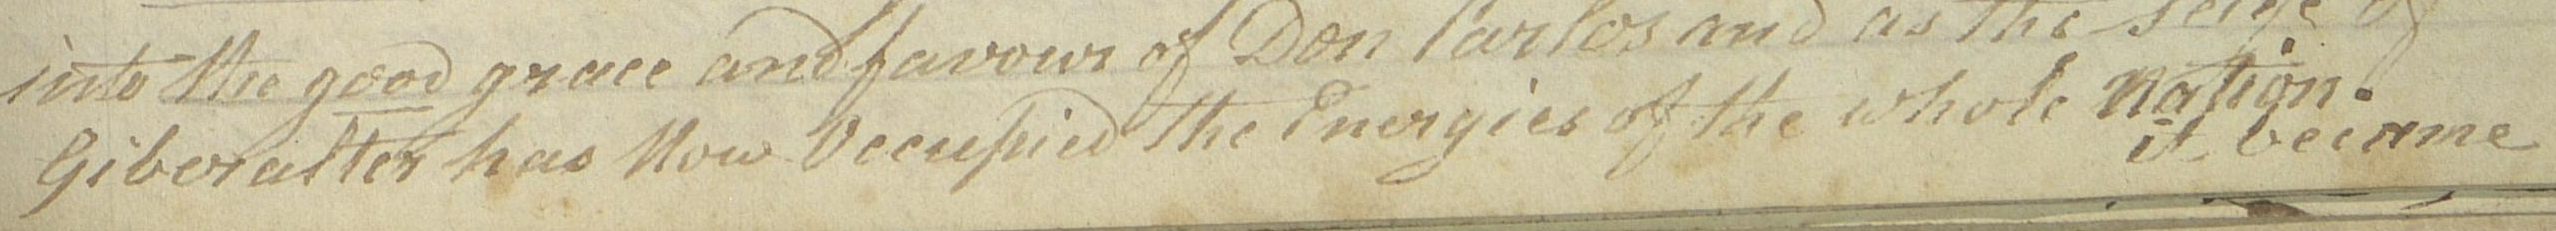Giberalter has Now Occupied the Energies of the whole Nation,
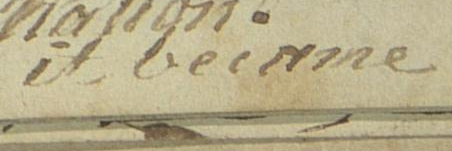it became
